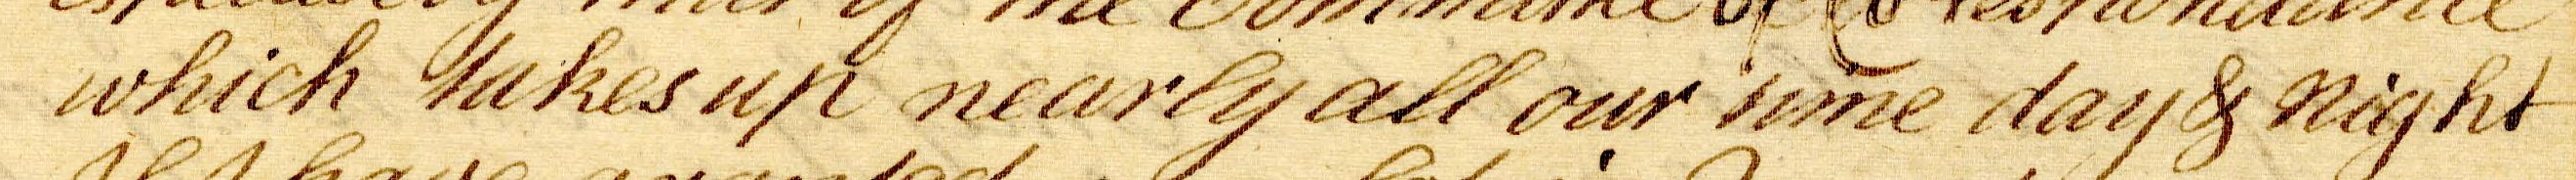which takes up nearly all our time day & Night
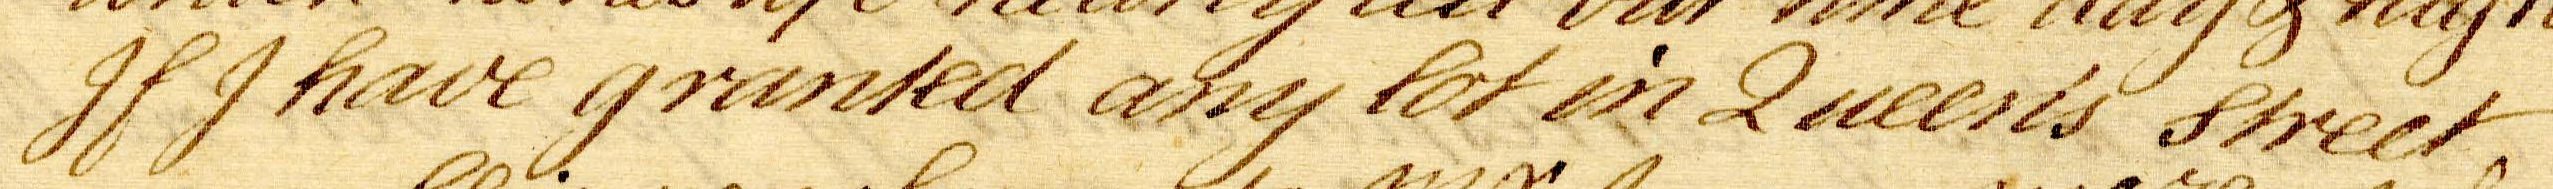If I have granted any lot in Queen's Street
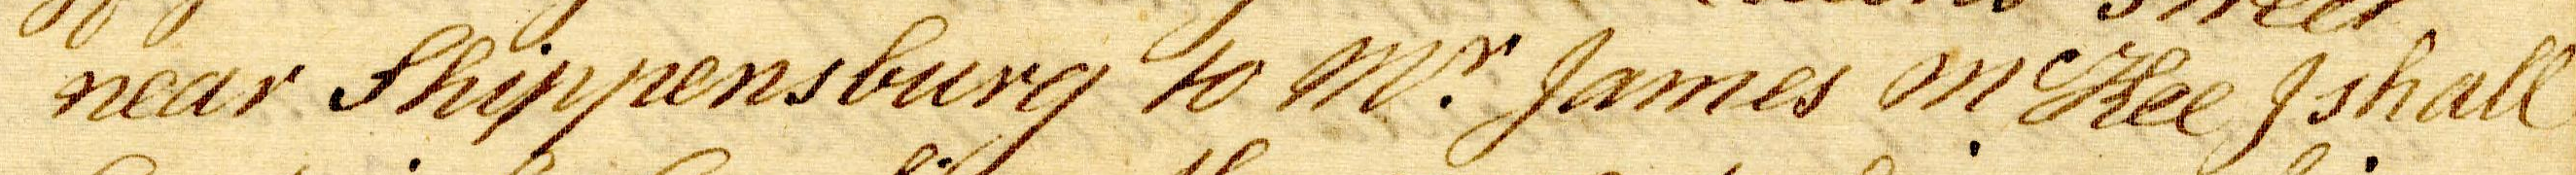near Shippensburg to M^r. James McKee I shall
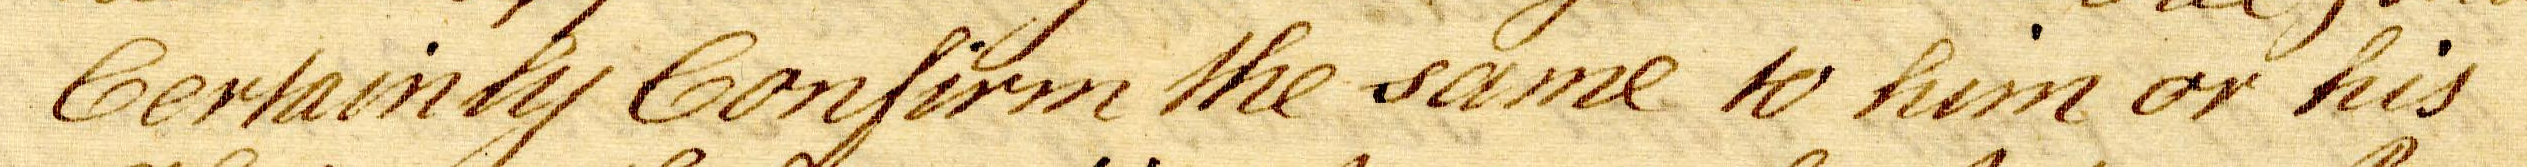Certainly Confirm the same to him or his
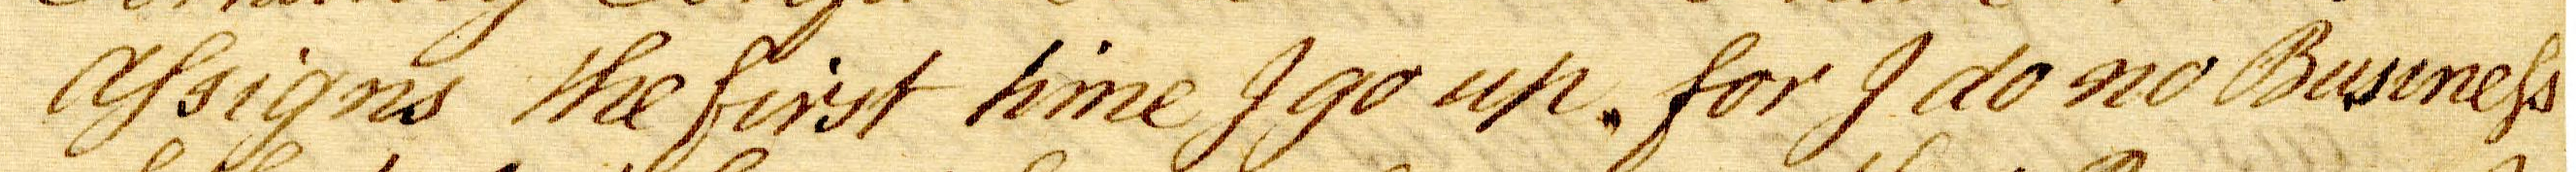Assigns the first time I go up, for I do no Business
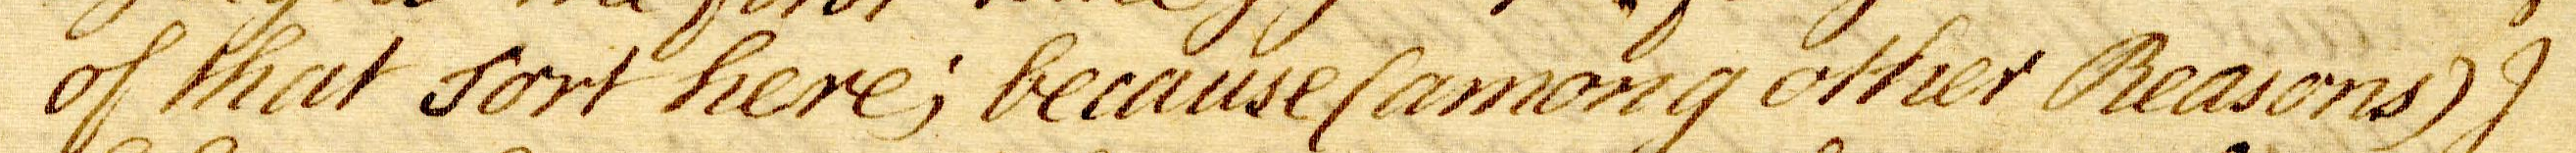of that sort here; because (among other Reasons) I
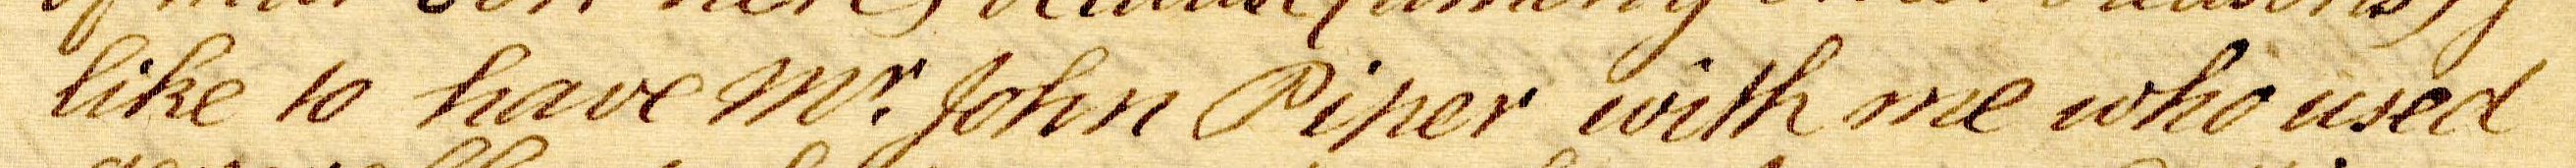like to have M^r. John Piper with me who used
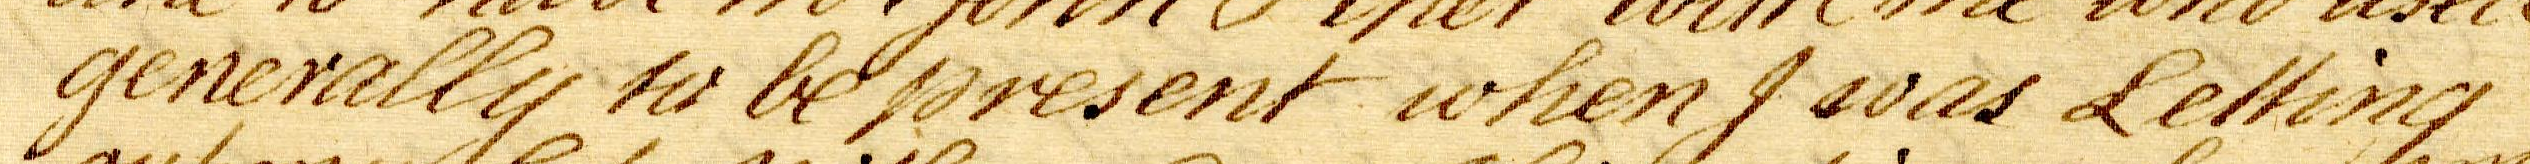generally to be present when I was Letting
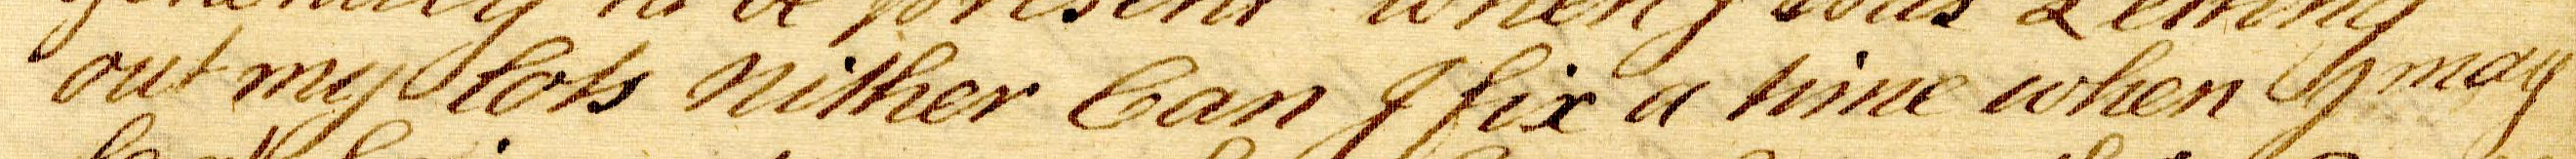out my lots nither Can I fix a tine when I may
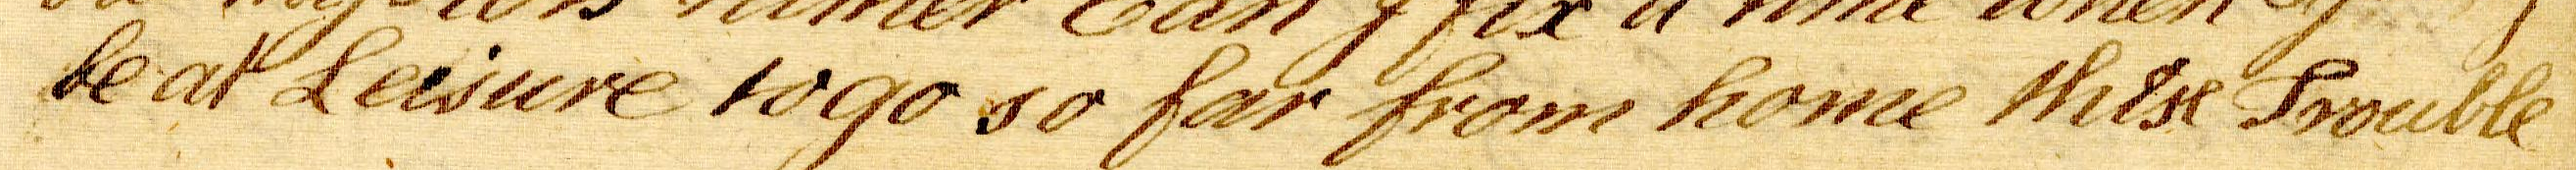be at Leisure to go so far from home these Trouble
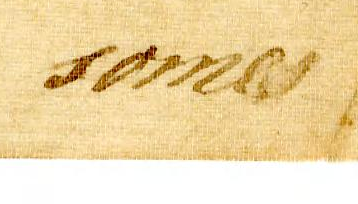somes
